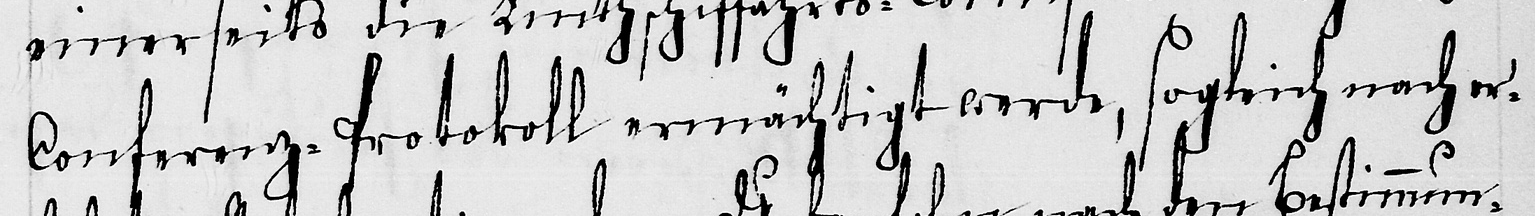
Conferenz-Protokoll ermächtigt werde, sogleich nach e¬
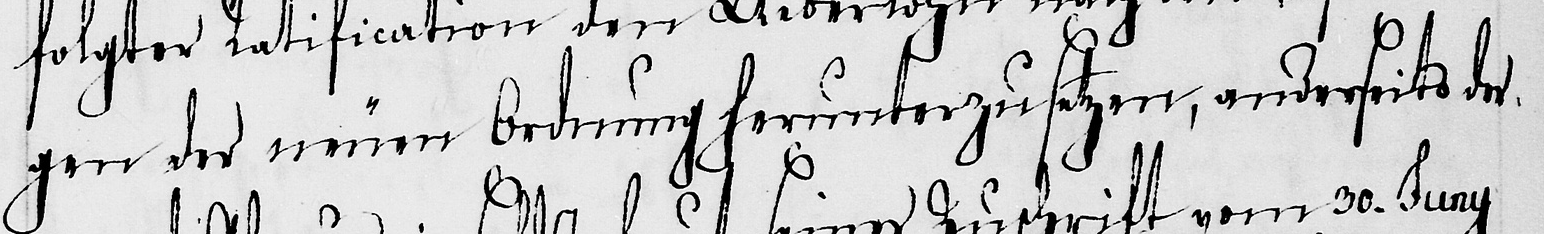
gen der neuen Ordnung herunterzusetzen, anderseits der
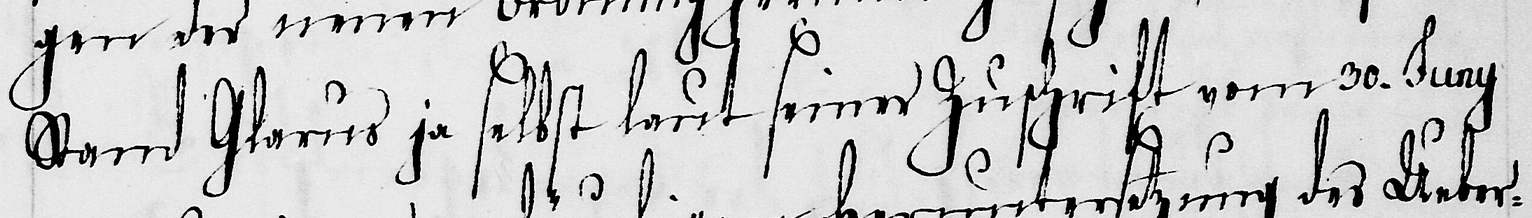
Stand Glarus ja selbst laut seiner Zuschrift vom 30. Juny
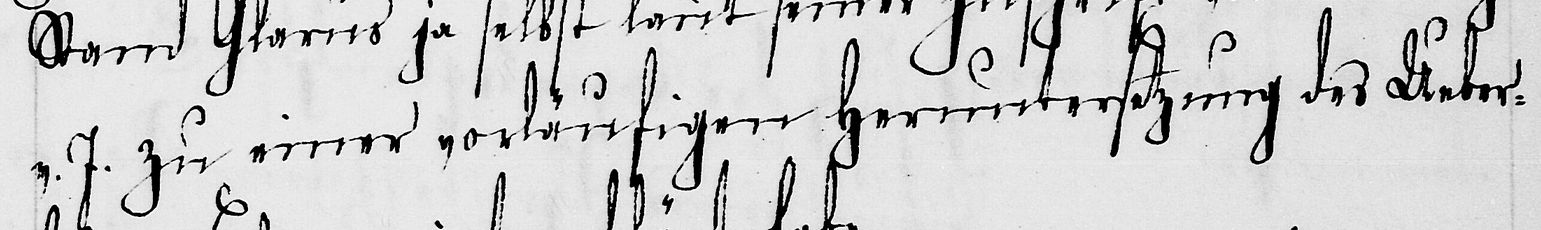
J. zu einer vorläufigen Heruntersetzung des Ueber¬
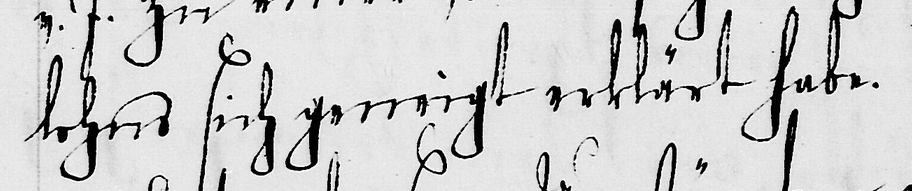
lohns sich geneigt erklärt habe.
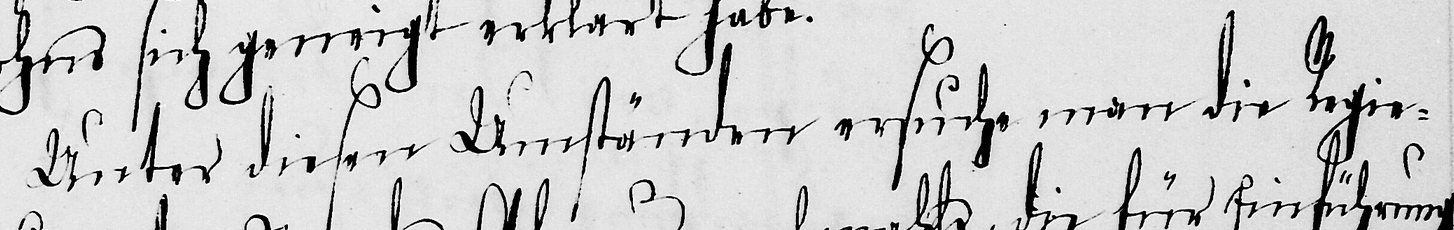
Unter diesen Umständen ersuche man die Regie¬
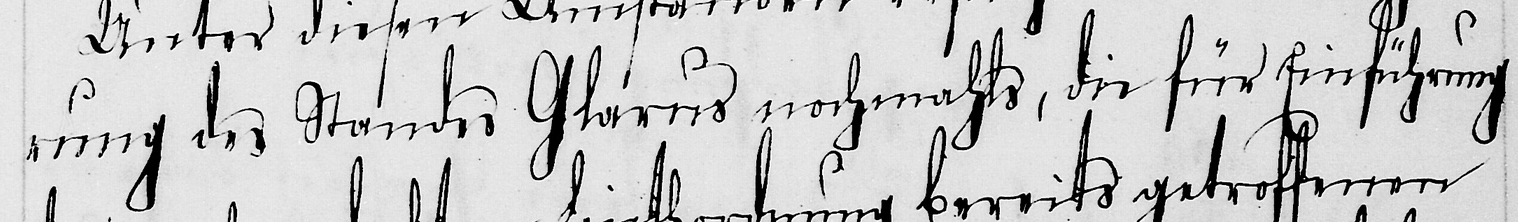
rung des Standes Glarus nochmahls, die für Einführung
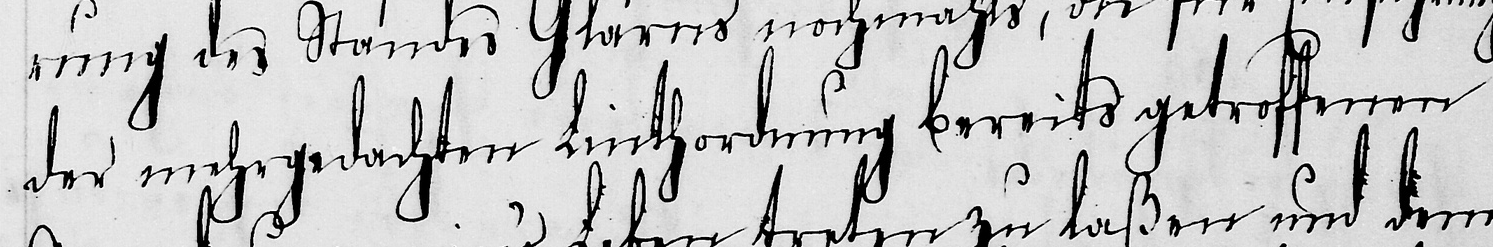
der mehrgedachten Linthordnung bereits getroffenen
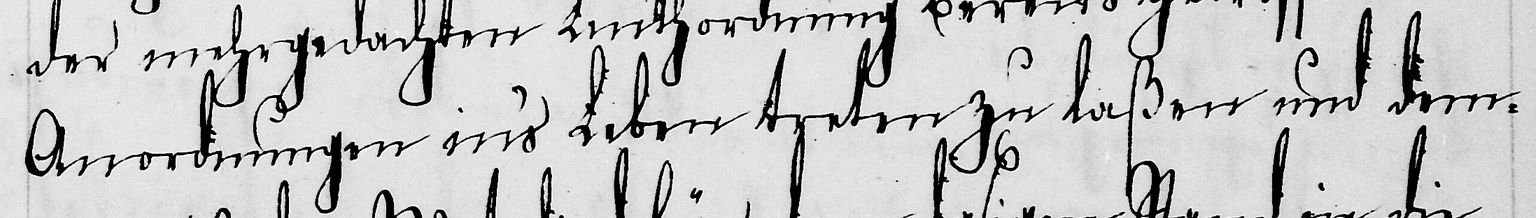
Anordnungen ins Leben treten zu laßen und dem¬
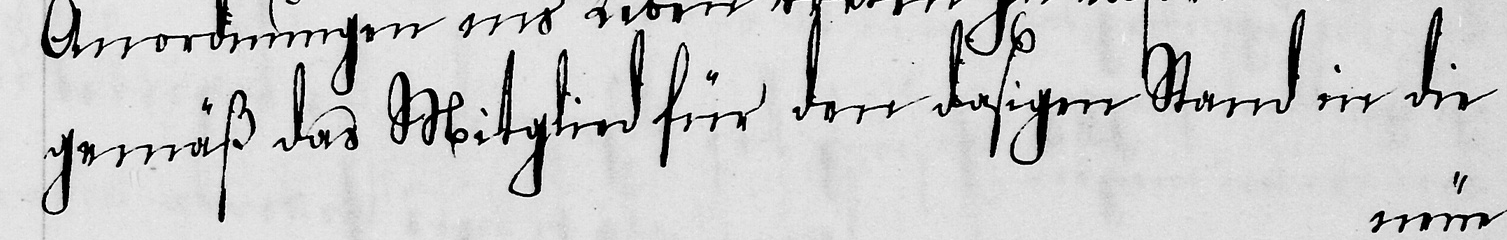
gemäß das Mitglied für den dasigen Stand in die
